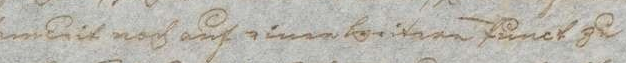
samkeit noch auf einen weitern Punct zu
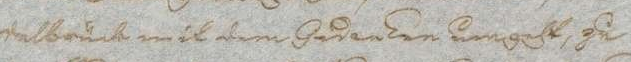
Delbrück mit dem Gedanken umgeht, zu
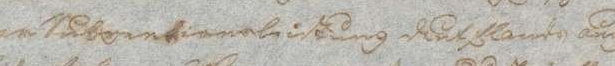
der Subventionsleistung Deutschlands auch
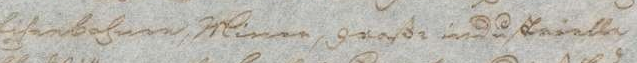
Eisenbahnen, Minen, große industrielle
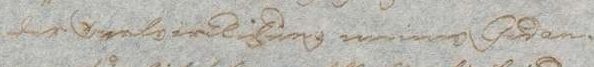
re der Verwirklichung meines Gedan-
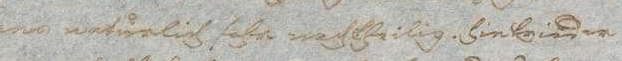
kens natürlich sehr nachtheilig. Hinwieder
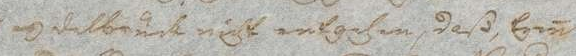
es Delbrück nicht entgehen, daß, wenn
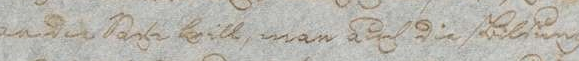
man die Sache will, man auch die Bildung
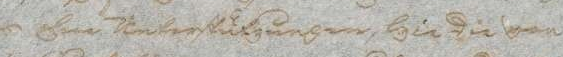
es ohne Unterstützungen, wie die von
